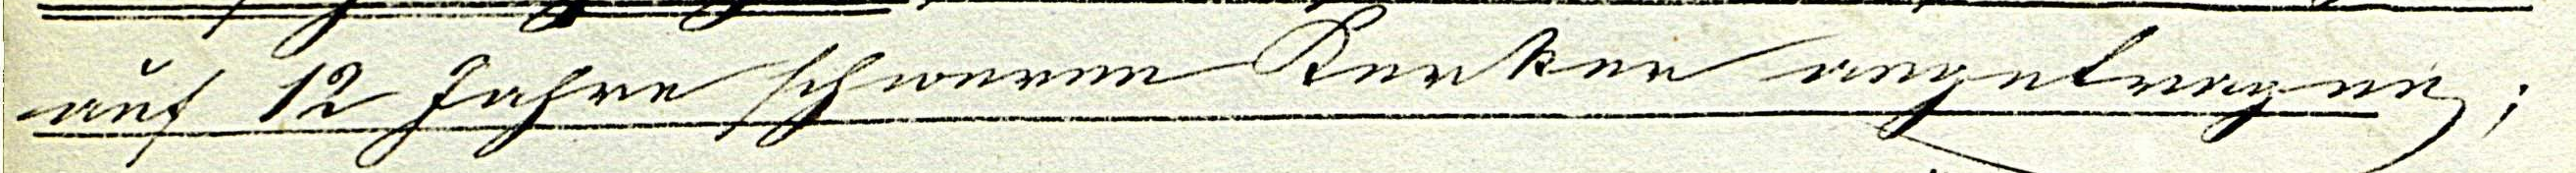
auf 12 Jahre schweren Kerker angetragen;
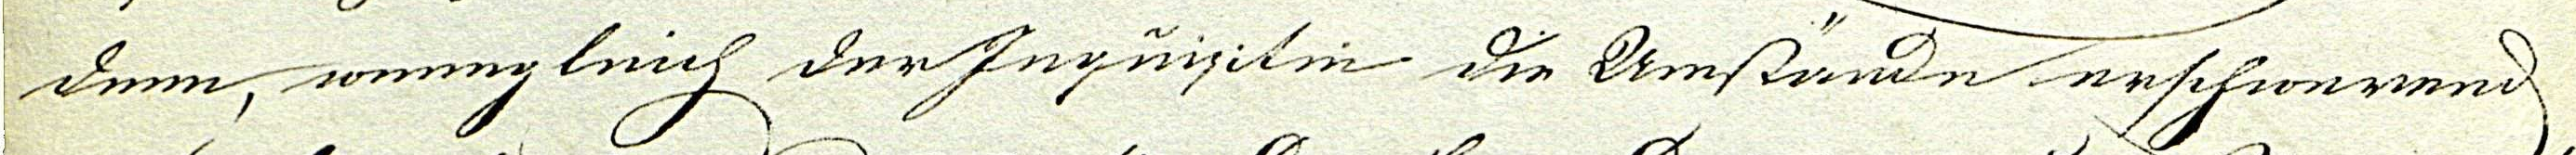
denn, wenngleich der Inquisitin die Umstände erschwerend
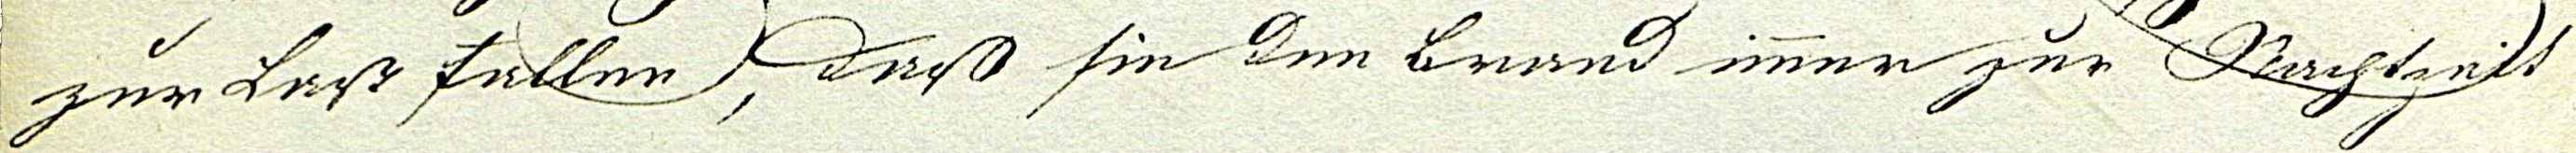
zur Last stellen, daß sie den Brand immer zur Nachtzeit
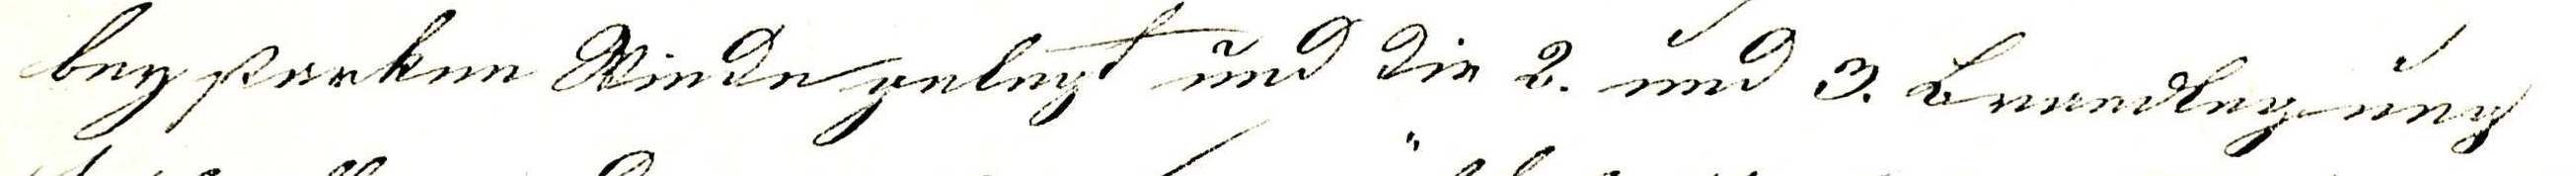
bey starken Winde gelegt und die 2. und 3. Brandlegung
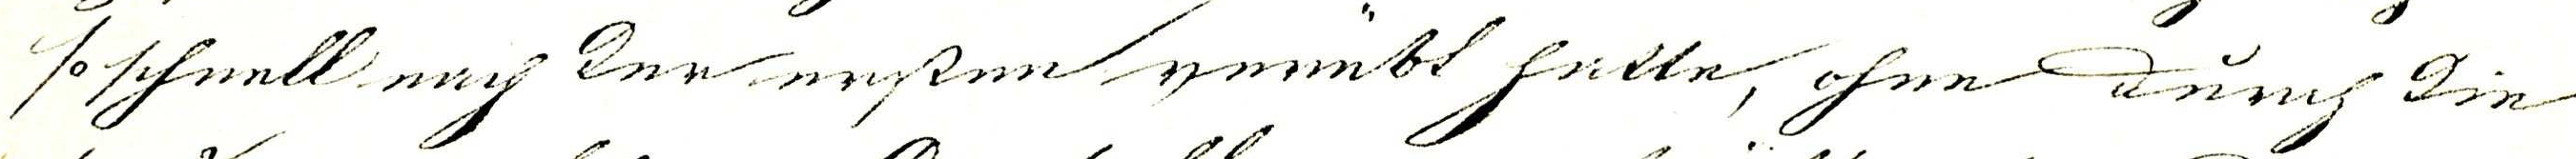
so schnell nach der ersten verübt hatte, ohne durch die
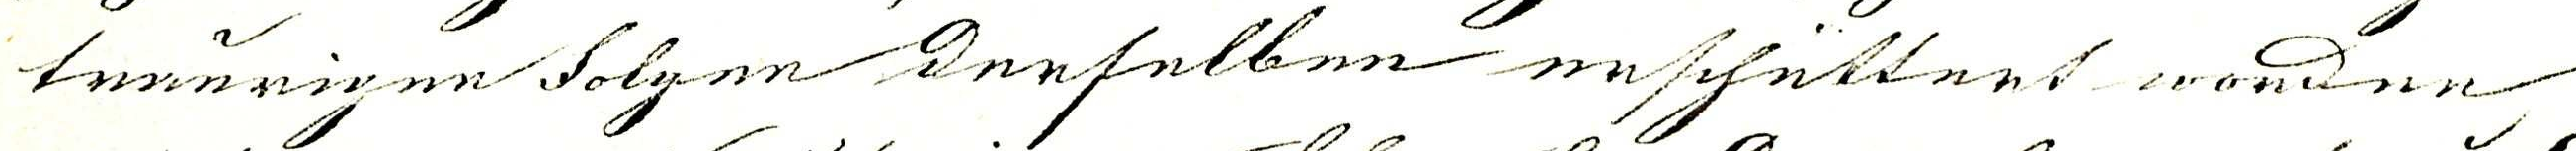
traurigen Folgen derselben erschüttert worden
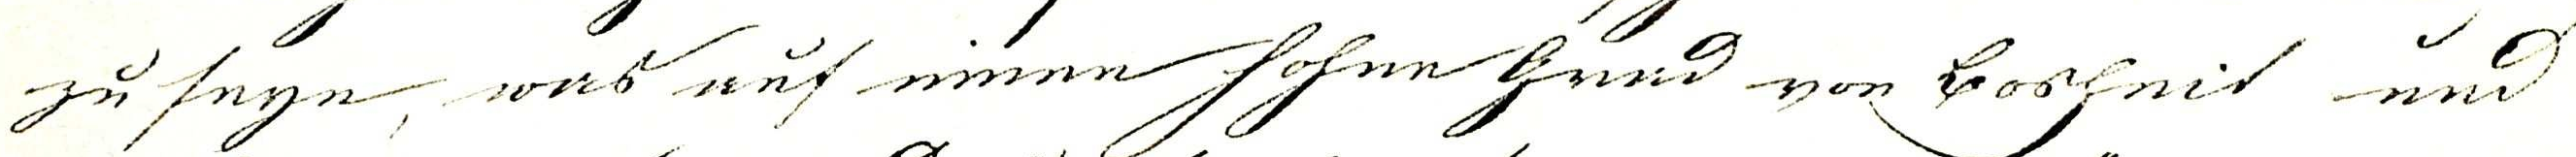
zu seyn, was auf einen hohen Grad von Bosheit und
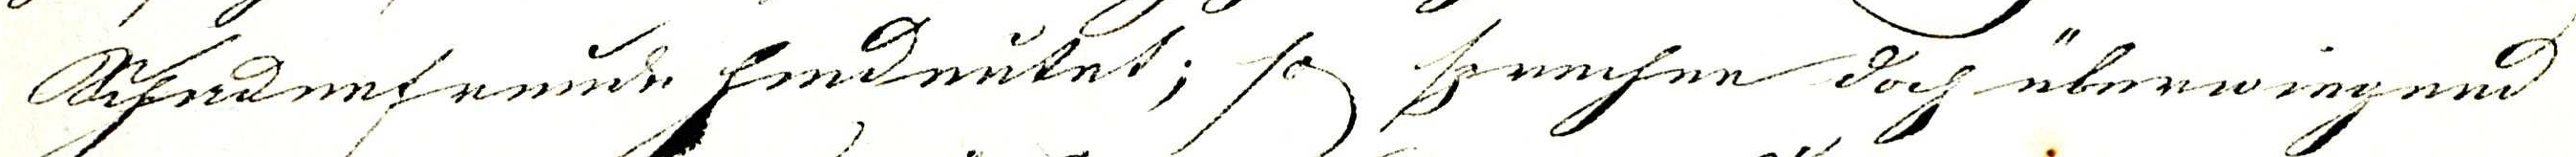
Schadenfreude hindeutet; so sprechen doch überwiegend
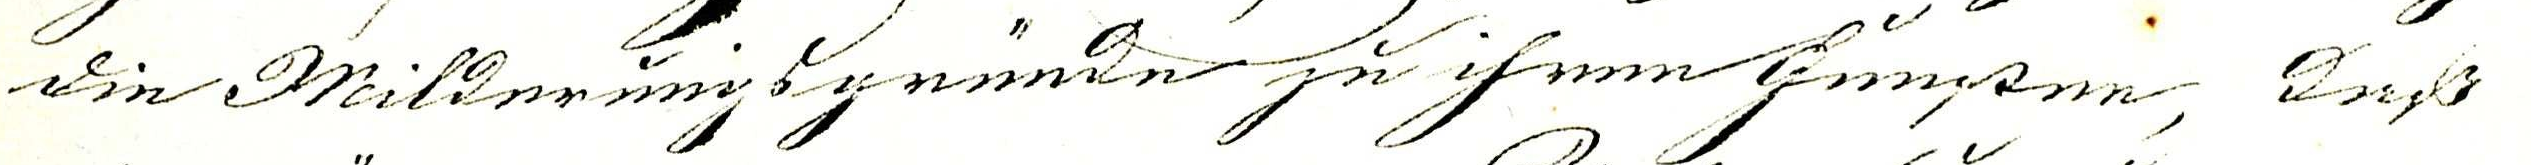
die Milderungsgründe zu ihrem Gunsten, daß
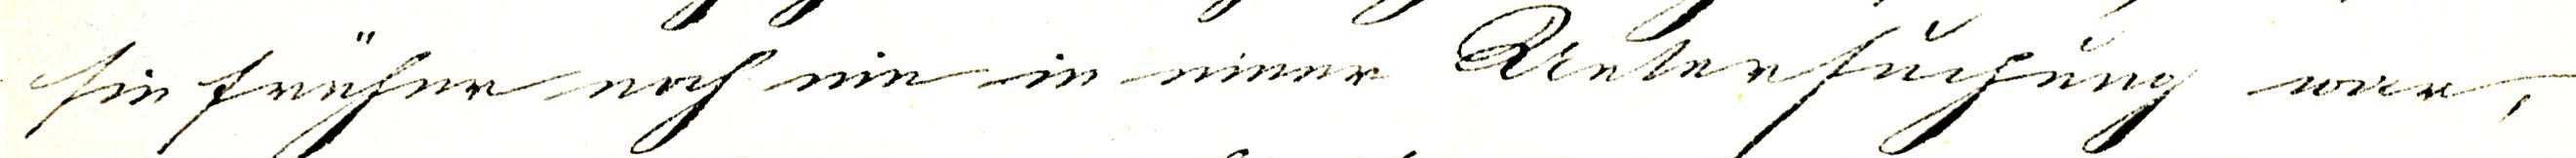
sie früher noch ein in einer Untersuchung war,
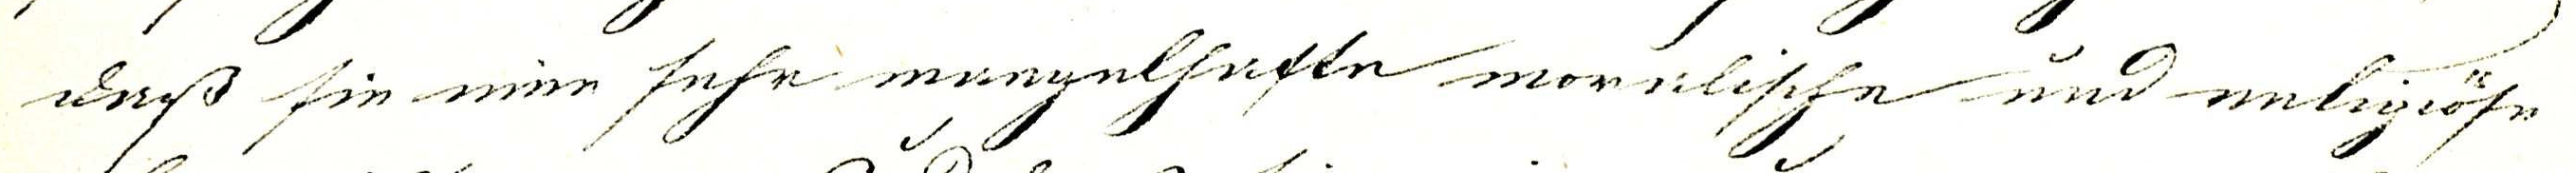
daß sie eine sehr mangelhafte moralische und religiöse
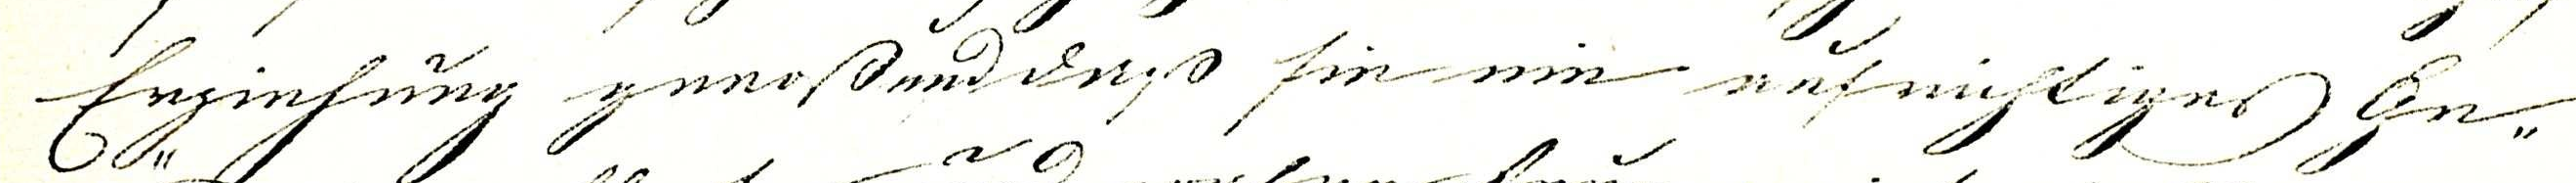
Erziehung genoß und daß sie ein aufrichtiges Ge¬
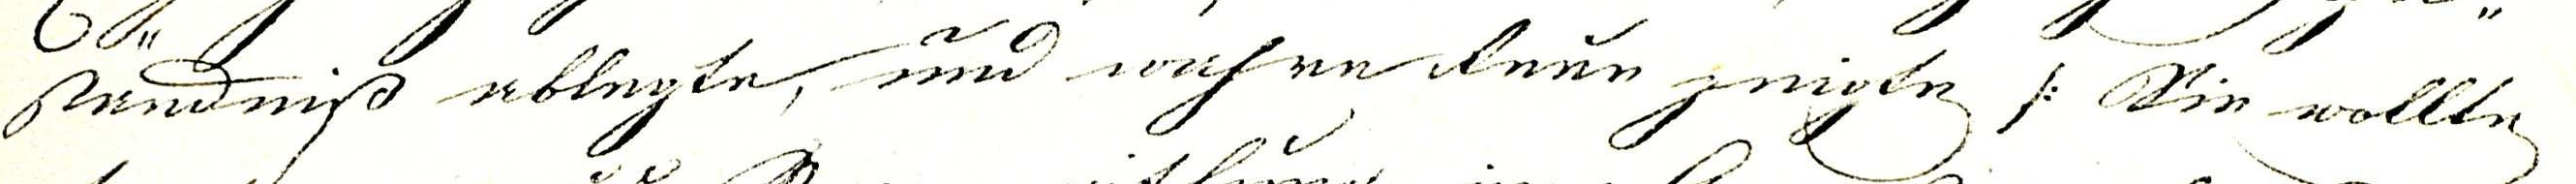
stuandniß ablegte, und wahre Reue zeigte (Sie wollte
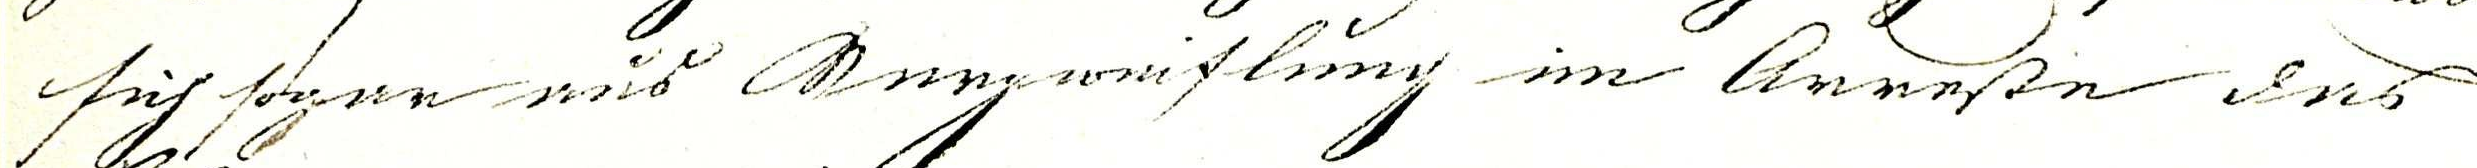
sich sogar aus Verzweiflung in Arreste das
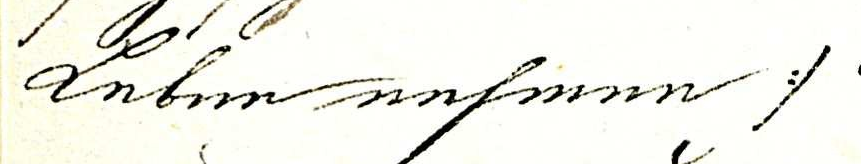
Leben nehmen).
